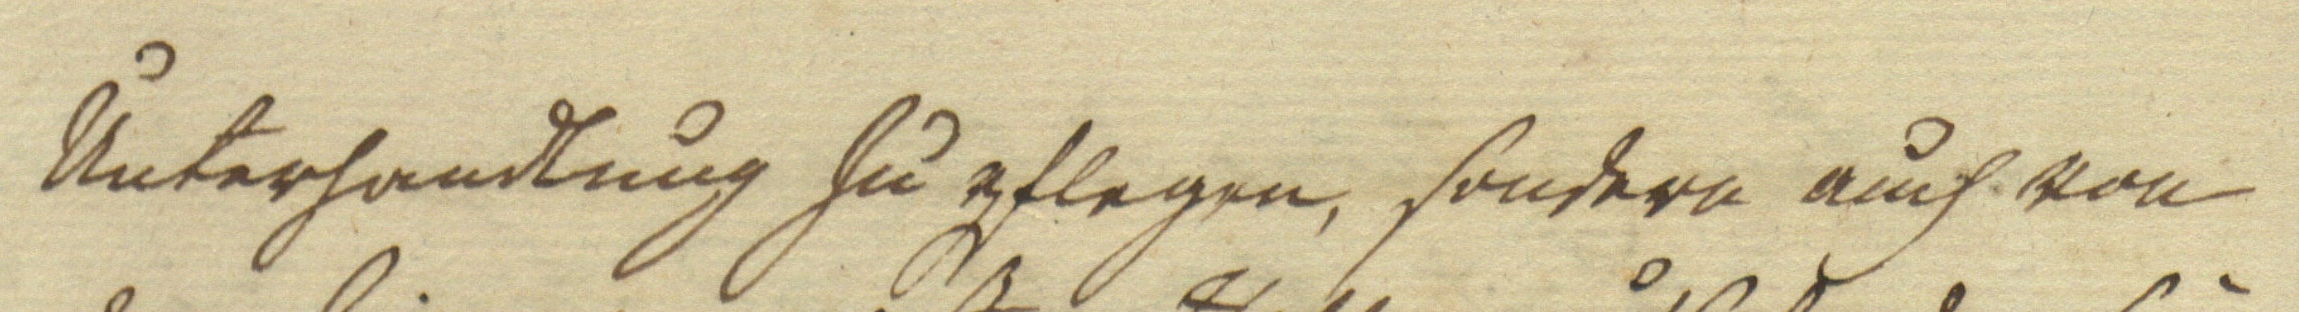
Unterhandlung zu pflegen, sondern auch von
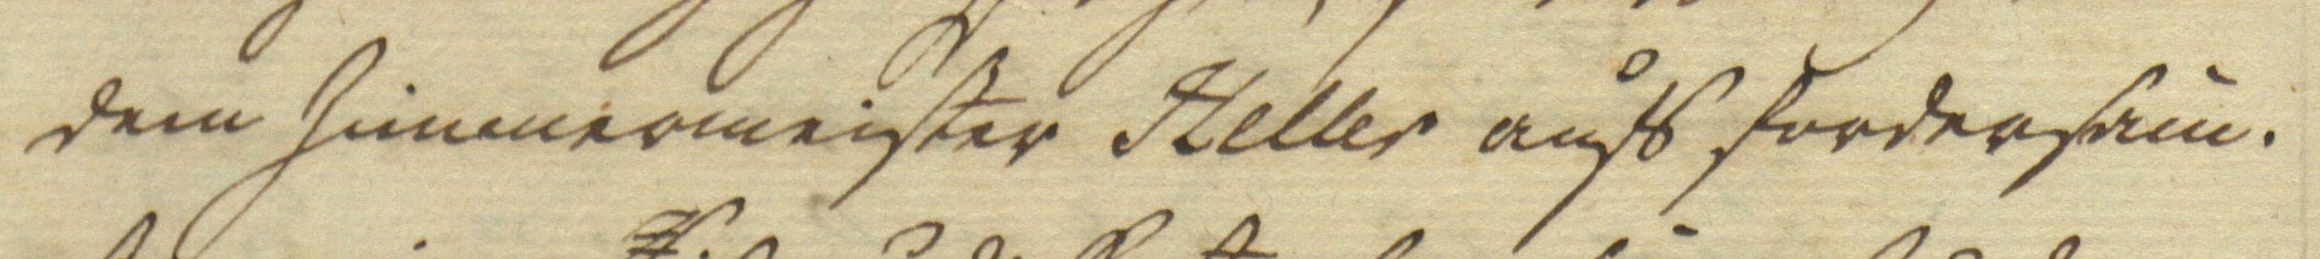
dem Zimmermeister Heller aufs fordersam¬
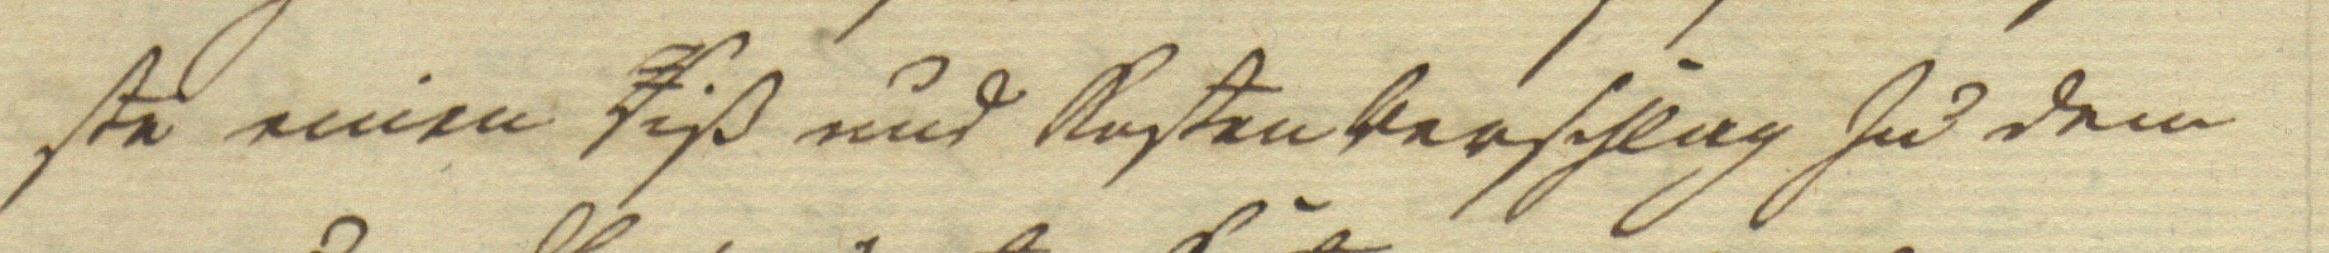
ste einen Riß und KostenVerschlag zu dem
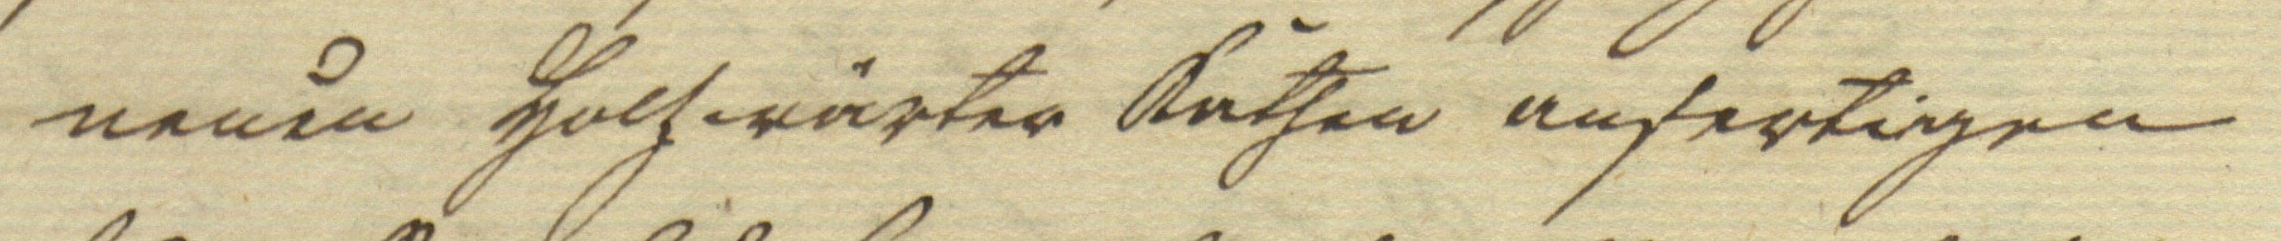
neuen Holzwärter Kathen anfertigen
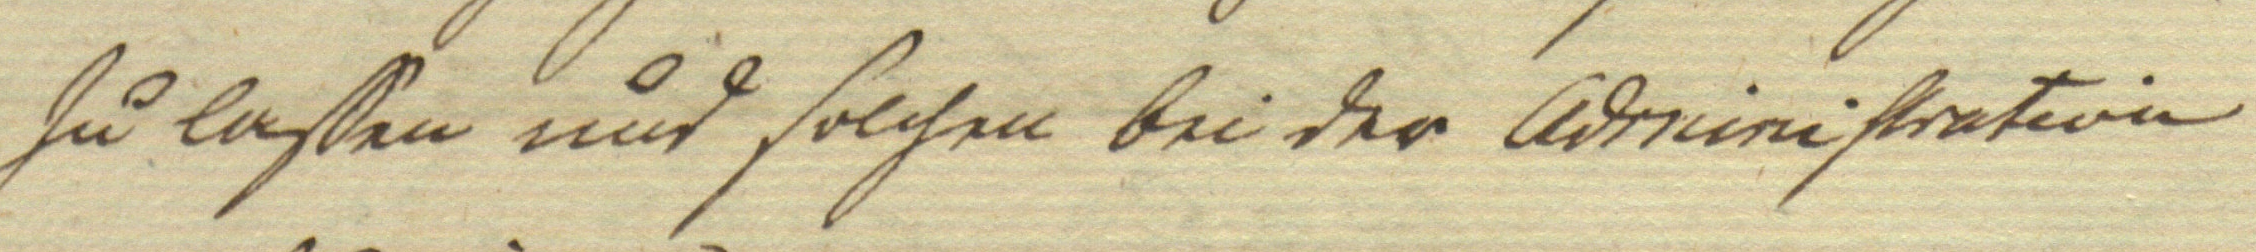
zu lassen und solchen bei der Administration
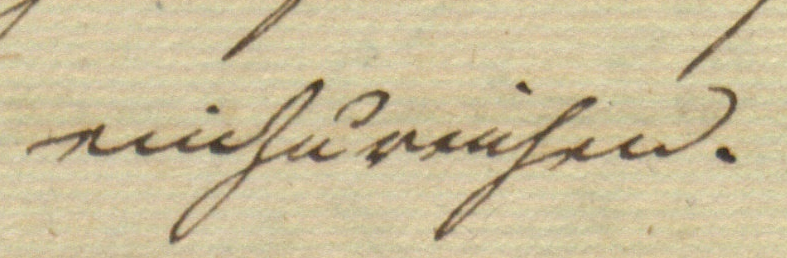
einzureichen.
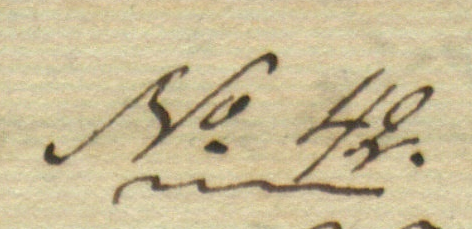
No 42.
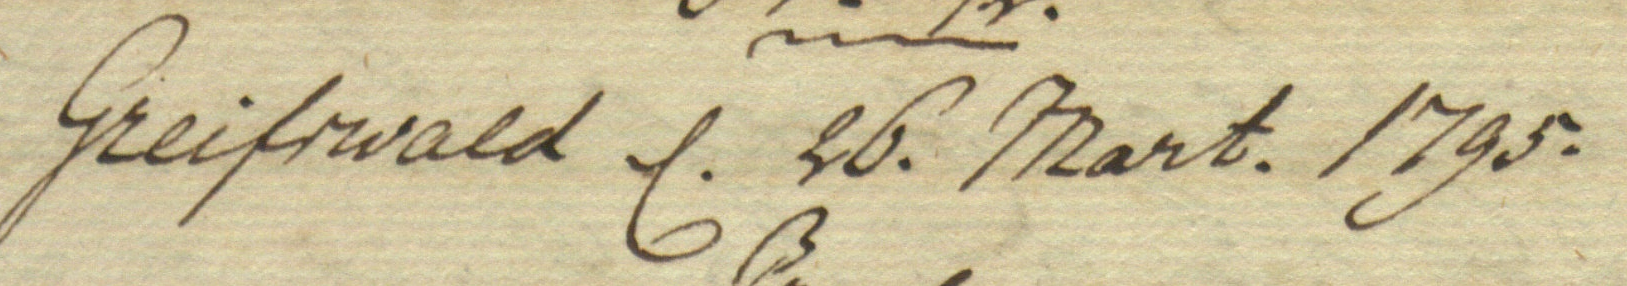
Greifswald d. 26. Mart. 1795.
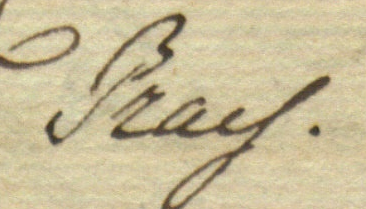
Praes.
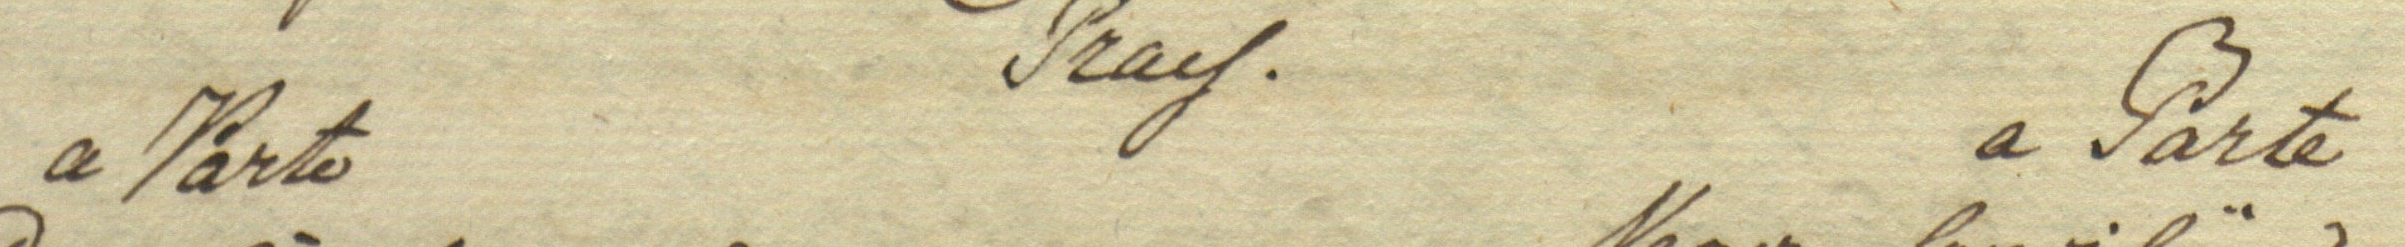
a Parte a Parte
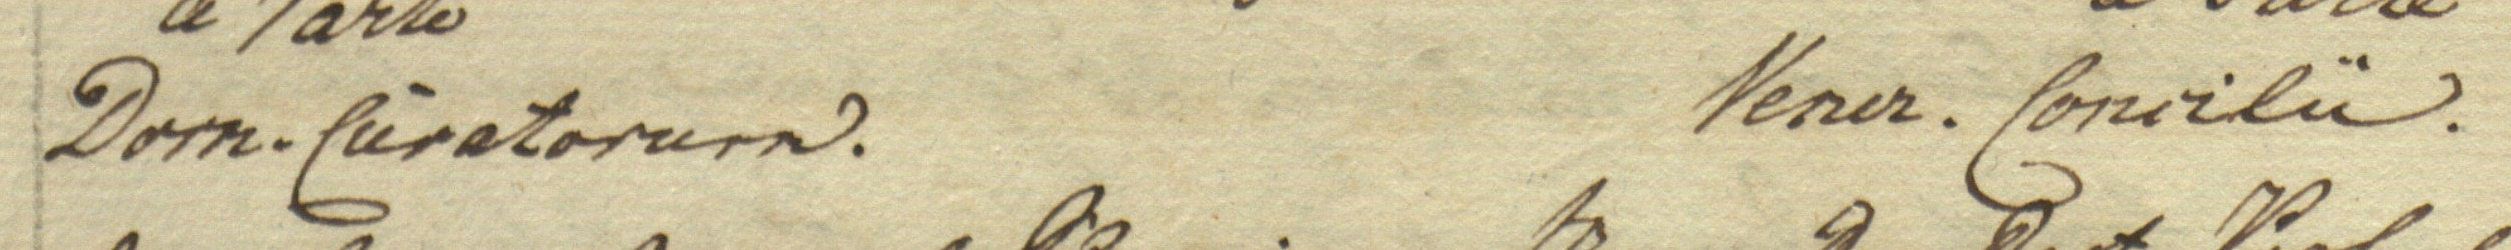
Dom. Curatorum. Vener. Concilii
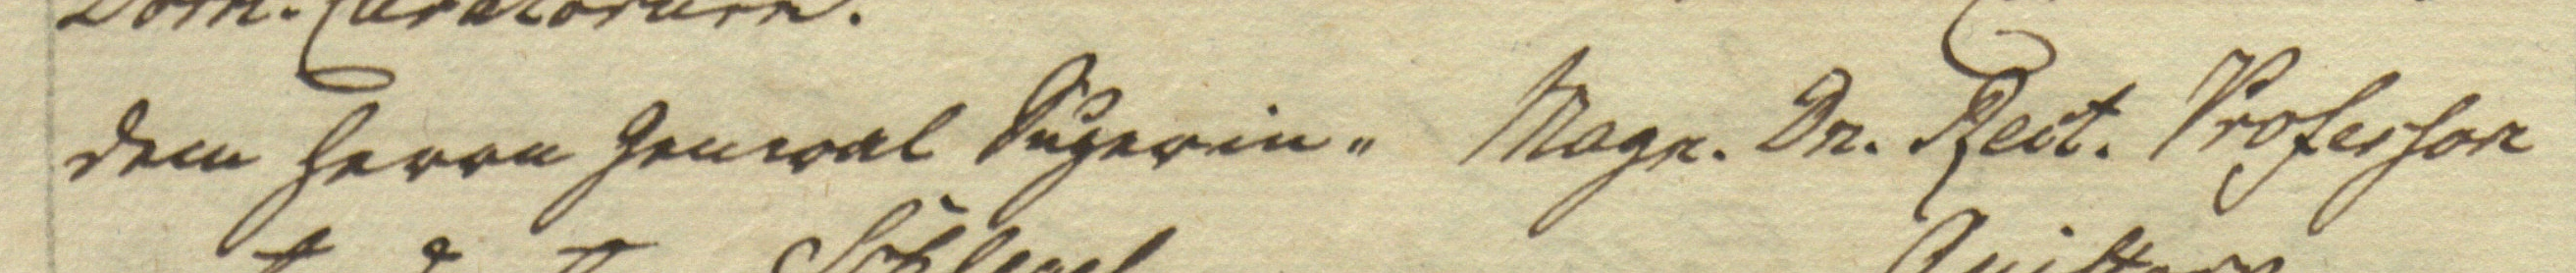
dem Herrn General Superin¬ Magn. Dn. Rect. Professor
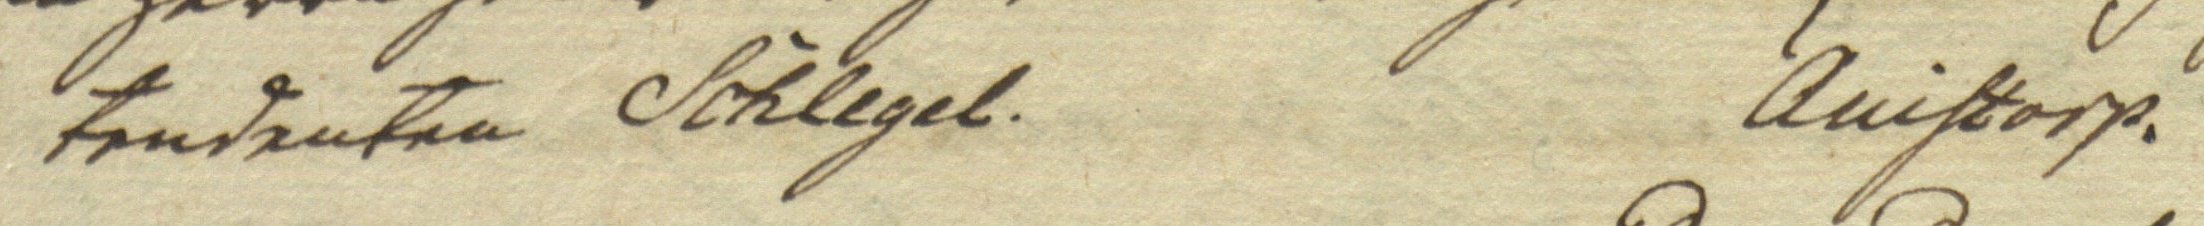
tendenten Schlegel. Quistorp.
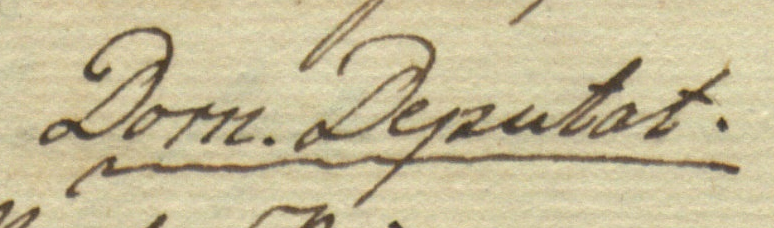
Dom. Deputat.
